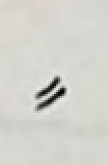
„
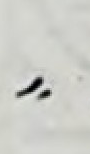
„
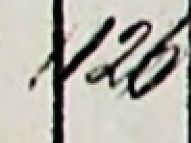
126
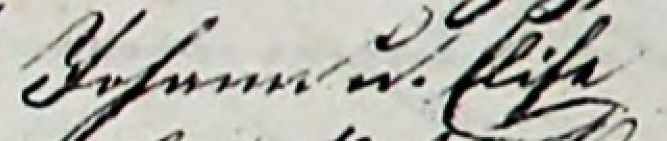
Johann u. Elise
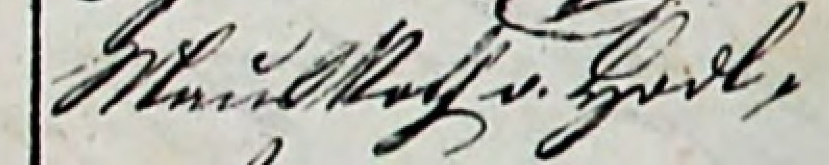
Mauskoth u. Hodl„
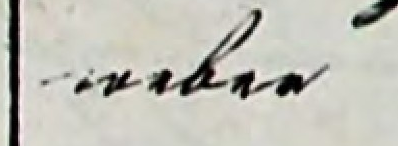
weber
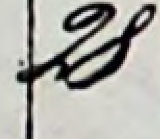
28
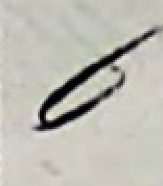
6
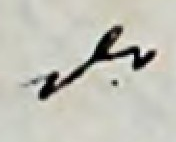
do
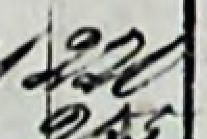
220
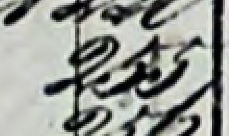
255
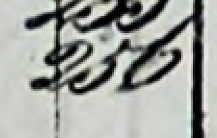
256
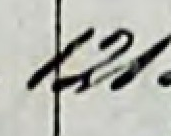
121
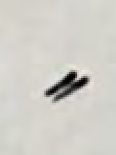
„
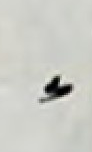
„
